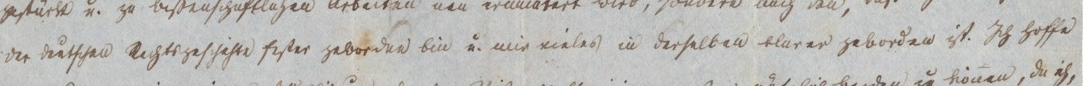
der deutschen Rechtsgeschichte fester geworden bin u. mir vieles in derselben klarer geworden ist. Ich hoffe
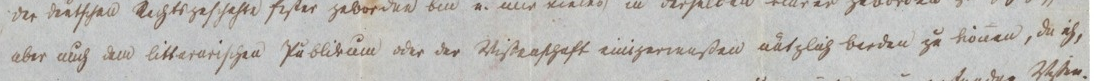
aber auch dem litterarischen Publikum oder der Wissenschaft einigermaßen nützlich werden zu können, da ich,
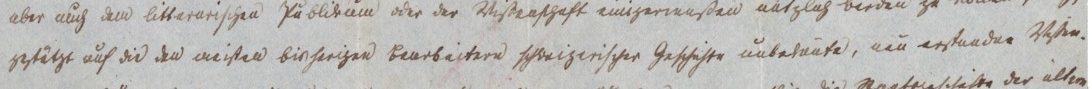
gestützt auf die den meisten bisherigen Bearbeitern schweizerischer Geschichte unbekannte, neu erstandne Wissen-
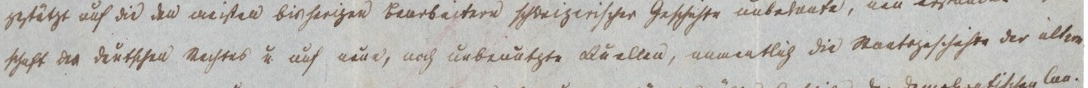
schaft des deutschen Rechtes u. auf neue, noch unbenutzte Quellen, namentlich die Staatsgeschichte der alten
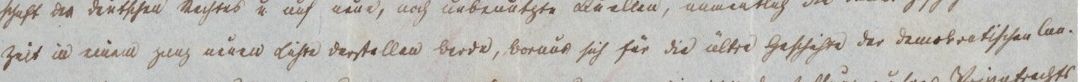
Zeit in einem ganz neuen Licht darstellen werde, woraus sich für die ältre Geschichte der demokratischen Can-
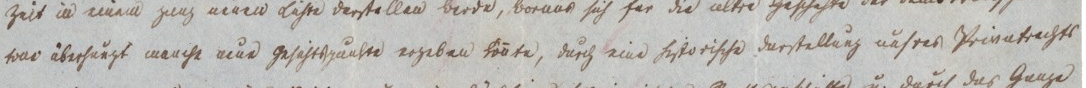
tone überhaupt manche neue Gesichtspunkte ergeben könnte, durch eine historische Darstellung unsres Privatrechts
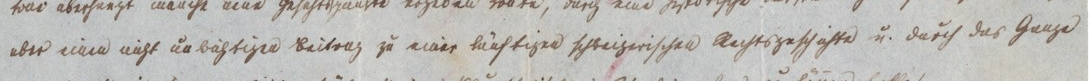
aber einen nicht unwichtigen Beitrag zu einer künftigen schweizerischen Rechtsgeschichte u. durch das Ganze
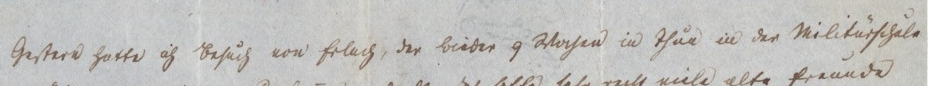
Gestern hatte ich Besuch von Erlach, der wieder 9 Wochen in Thun in der Militärschule
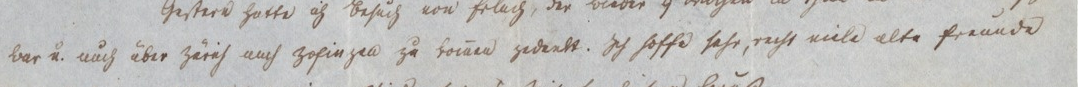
war u. auch über Zürich nach Zofingen zu kommen gedenkt. Ich hoffe sehr, recht viele alte Freunde
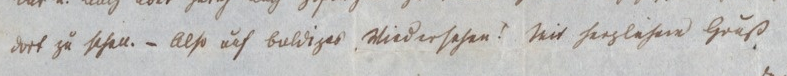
dort zu sehen. – Also auf baldiges Wiedersehen! Mit herzlichem Gruß
